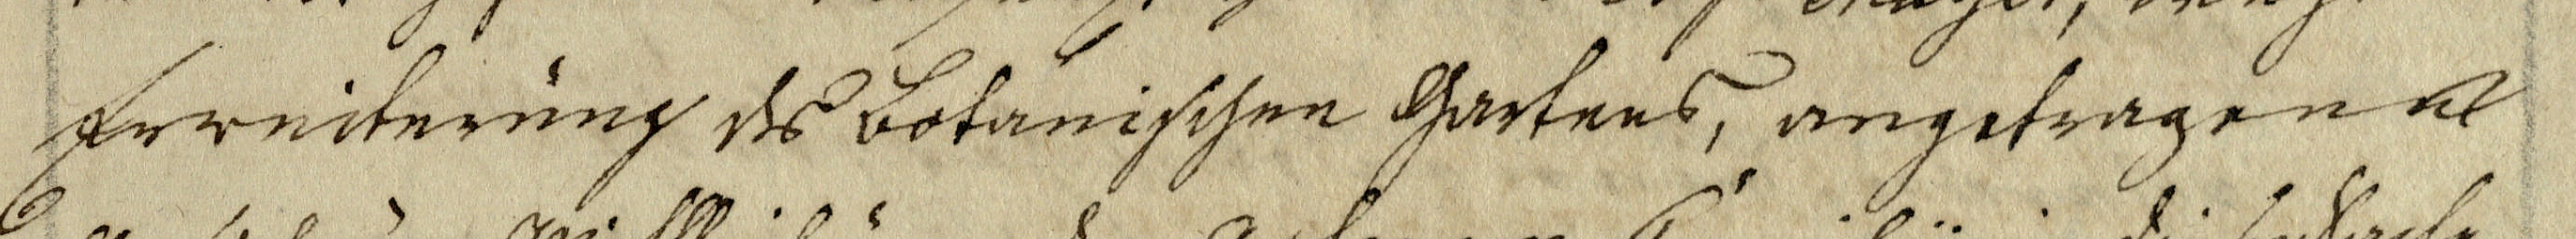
Erweiterung des Botanischen Gartens, angetragenen
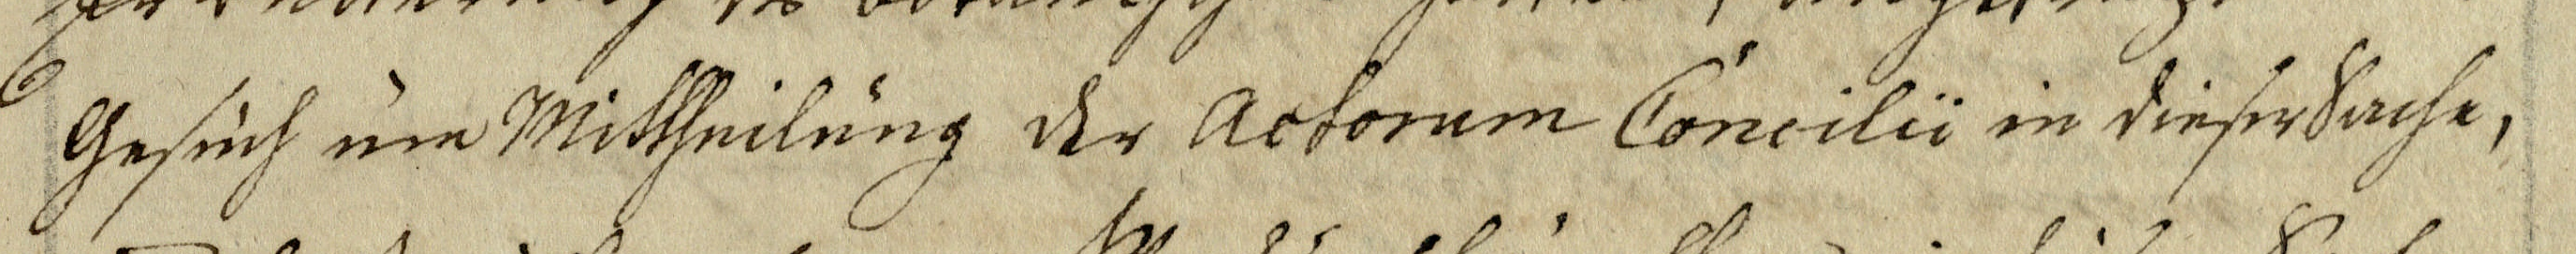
Gesuch um Mittheilung der Actorum Concilii in dieser Sache,
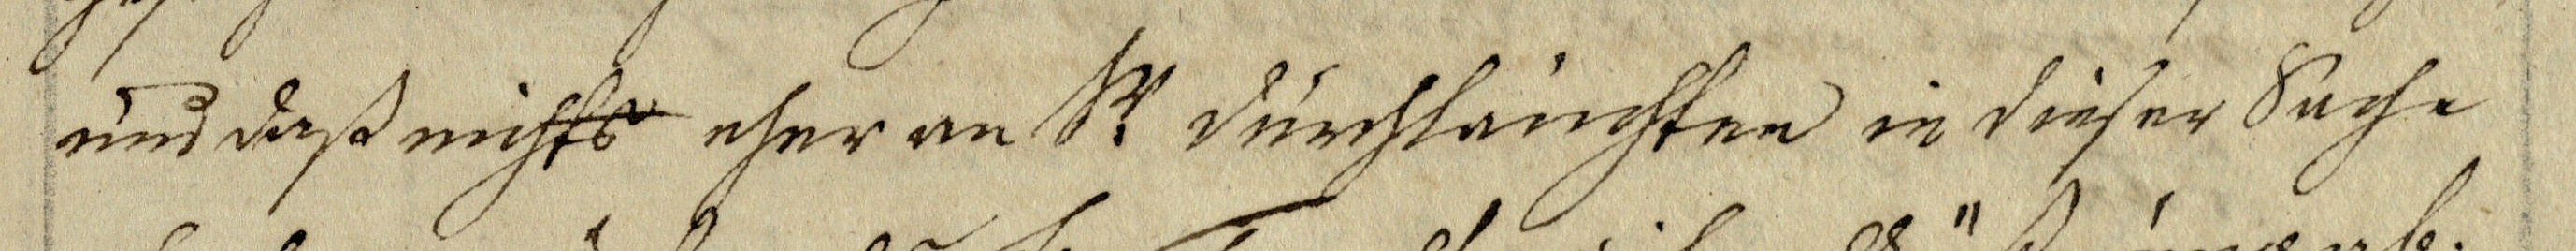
und daß nichts eher an Sr Durchlauchten in dieser Sache
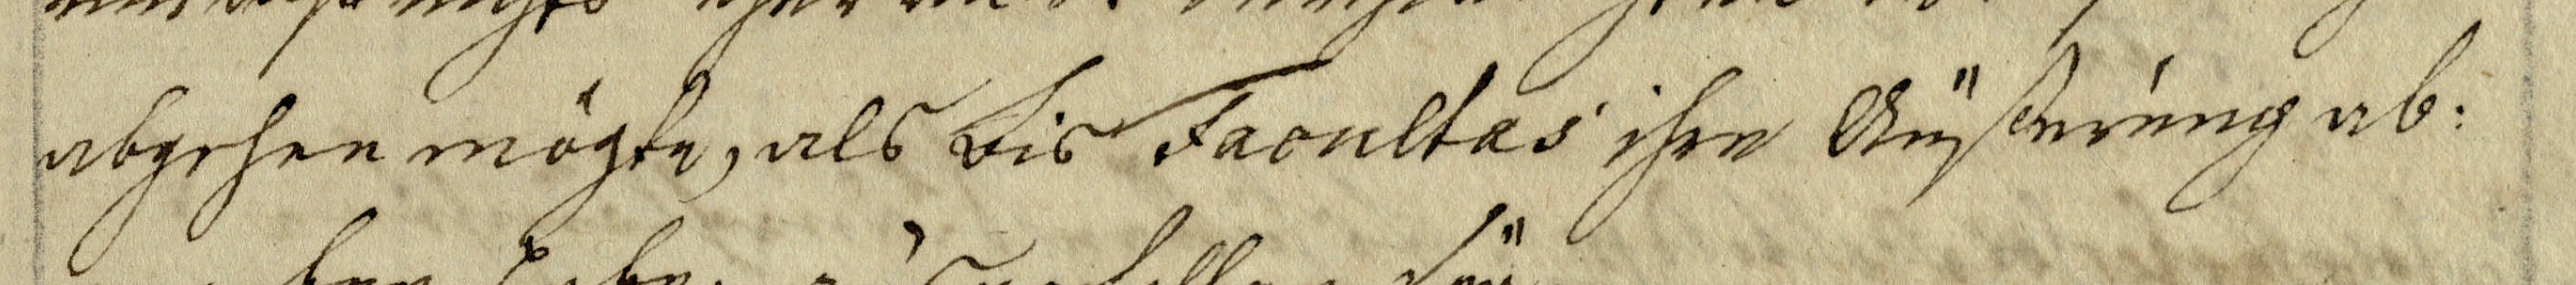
abgehen mögte, als bis Facultas ihre Äußerung ab¬
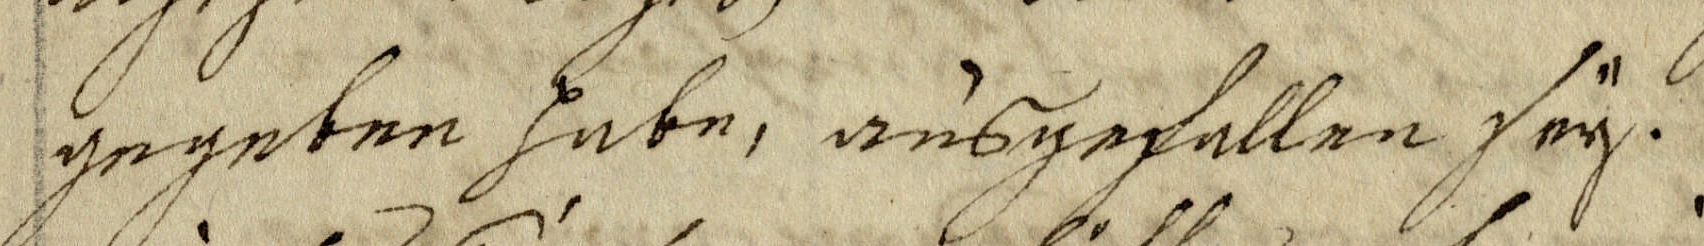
gegeben habe, ausgefallen seÿ.
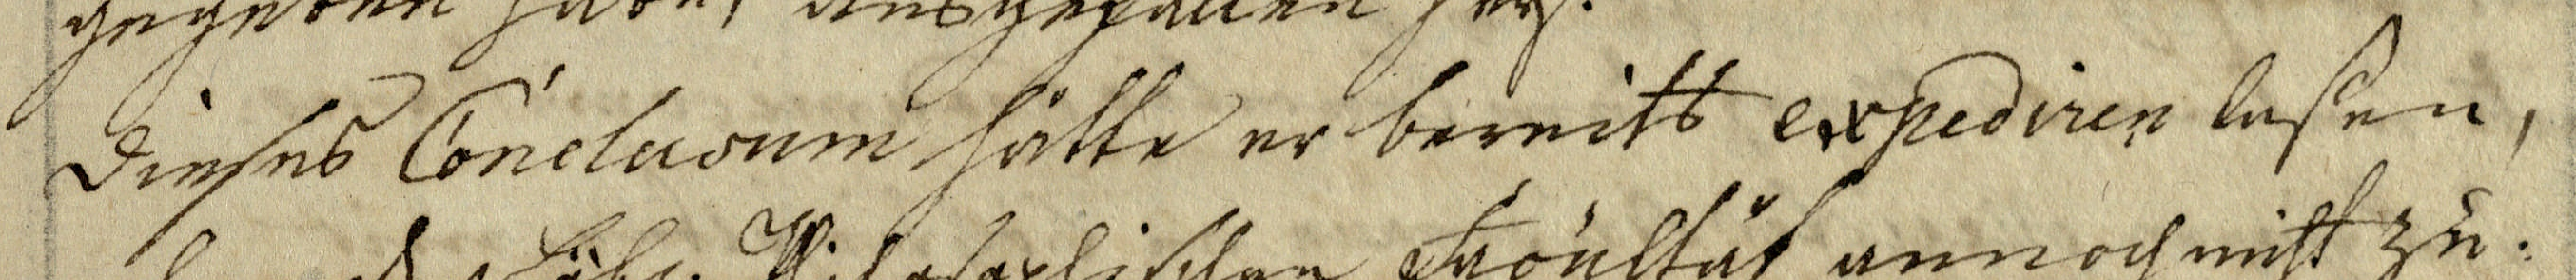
Dieses Conclusum hätte er bereits expediren laßen,
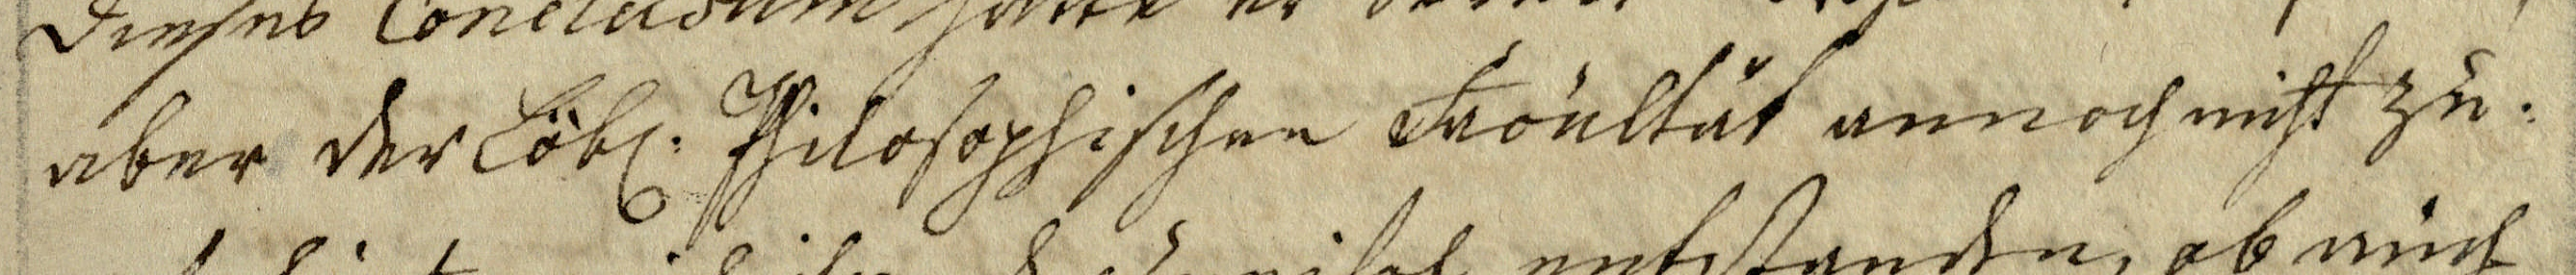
aber der Löbl. Philosophischen Facultät annoch nicht zu¬
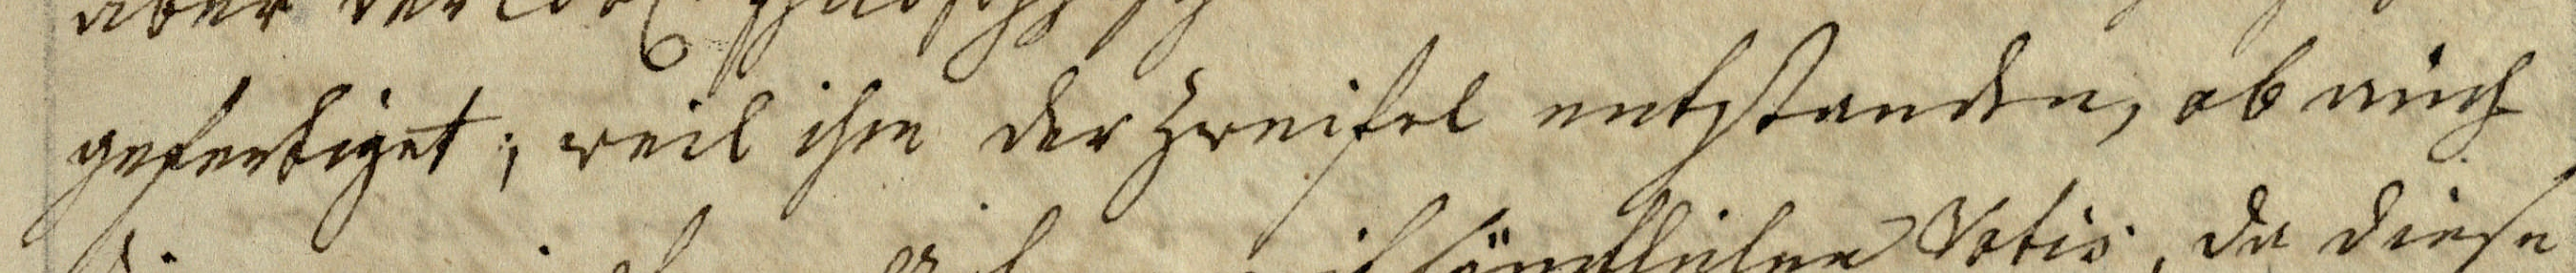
gefertiget; weil ihm der Zweifel entstanden, ob auch
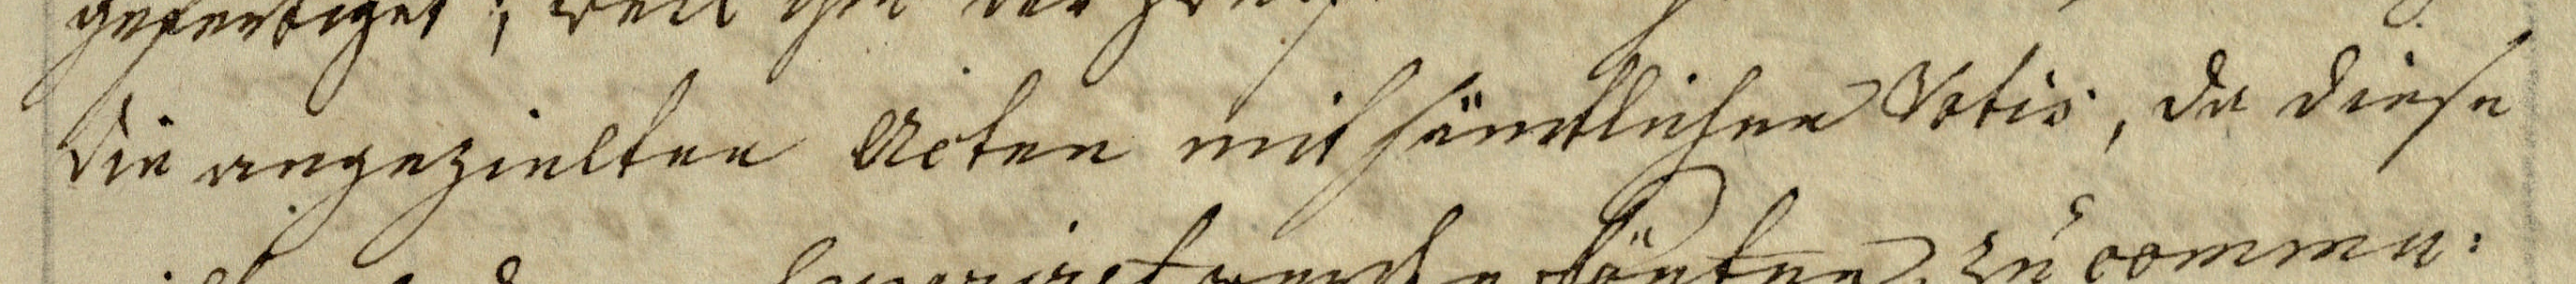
die angezielten Acten mit sämtlichen Votis, da diese
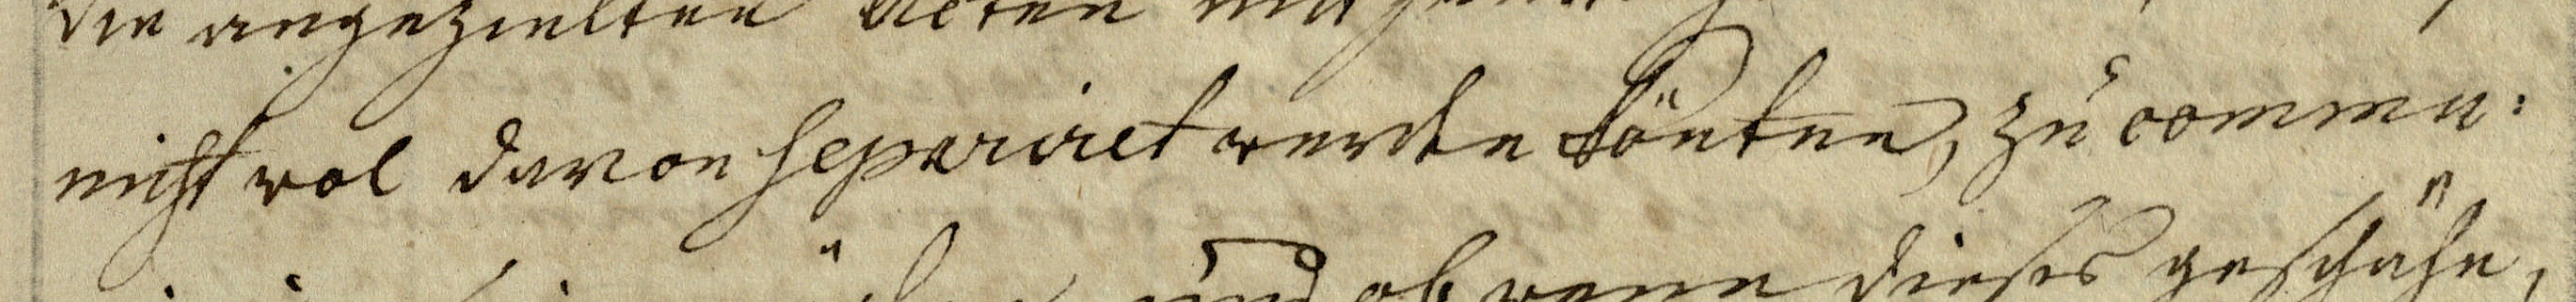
nicht wohl davon separiret werden könten, zu commu¬
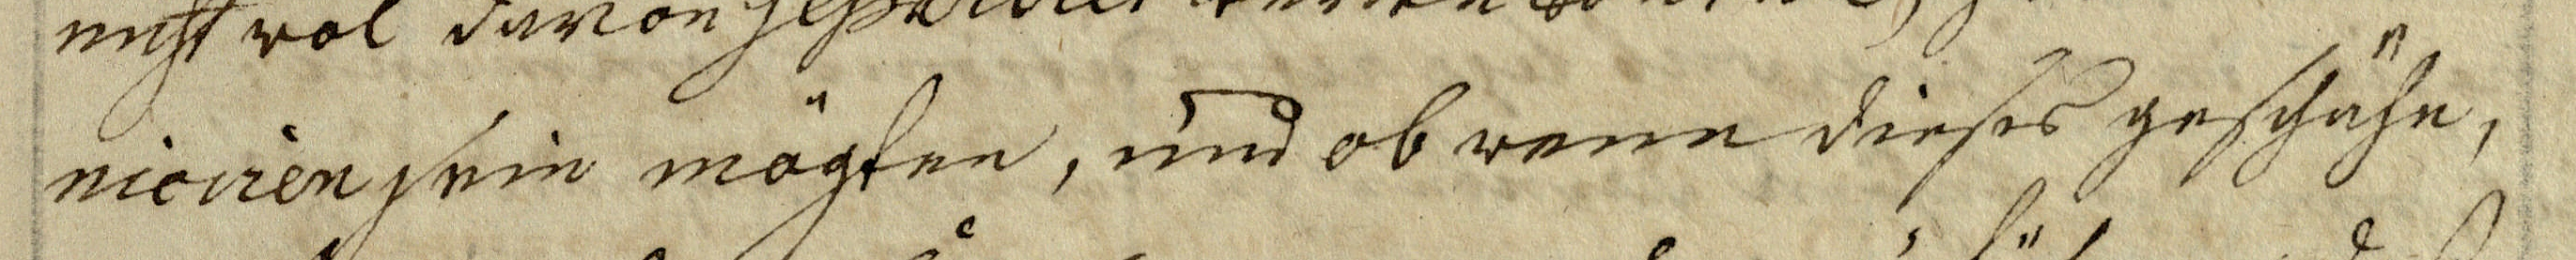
niciren sein mögten, und ob wenn dieses geschähe,
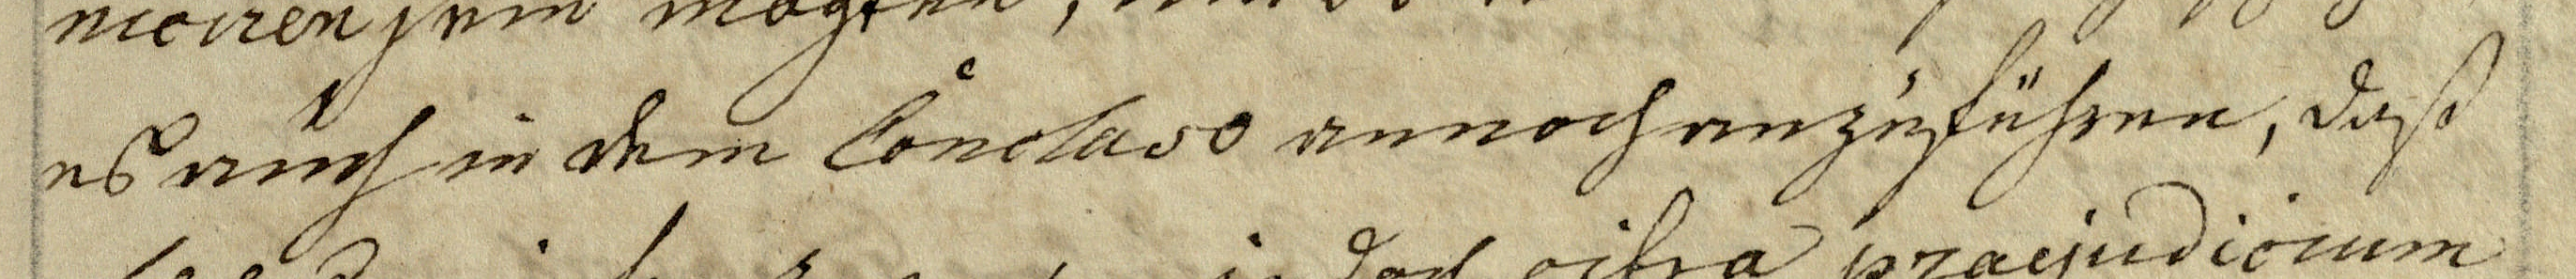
es auch in dem Concluso annoch anzuführen, daß
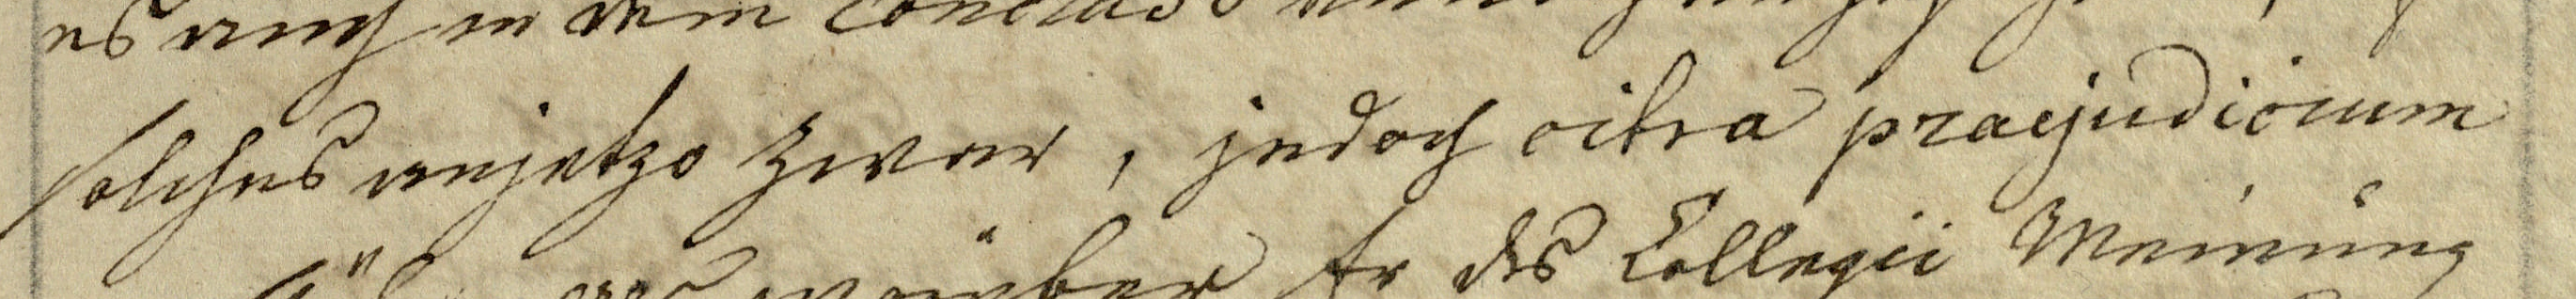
solches anjetzo zwar, jedoch citra praejudicium
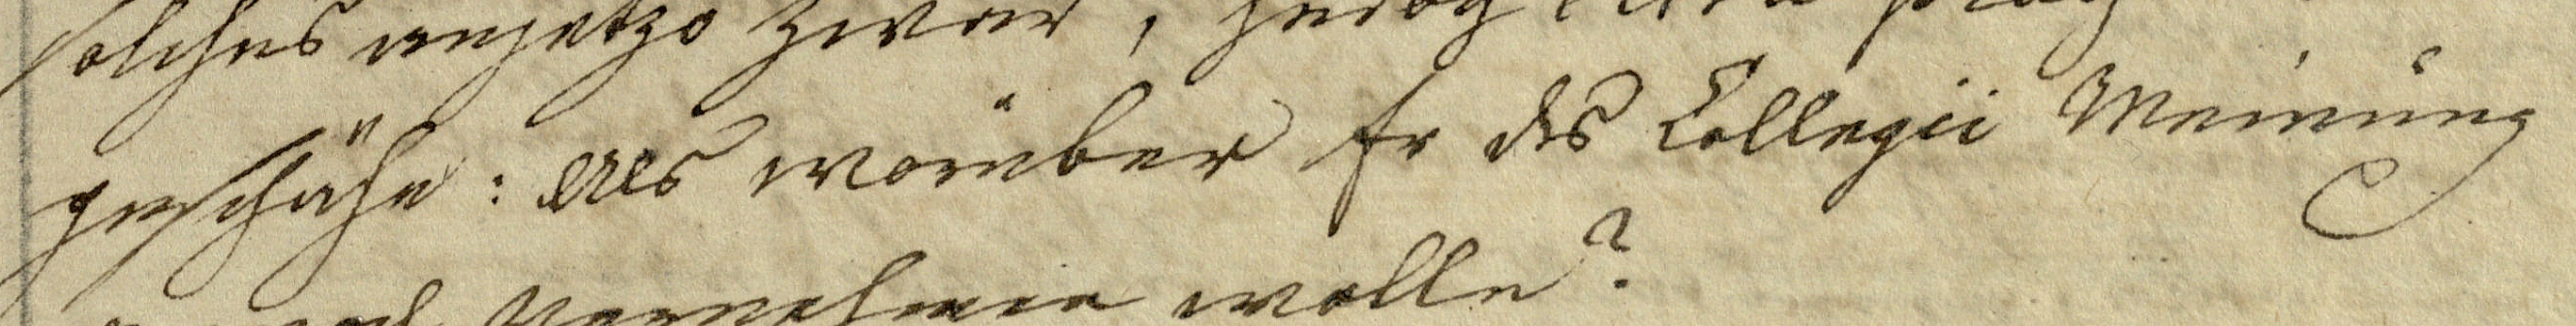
geschähe: Als worüber Er des Collegii Meinung
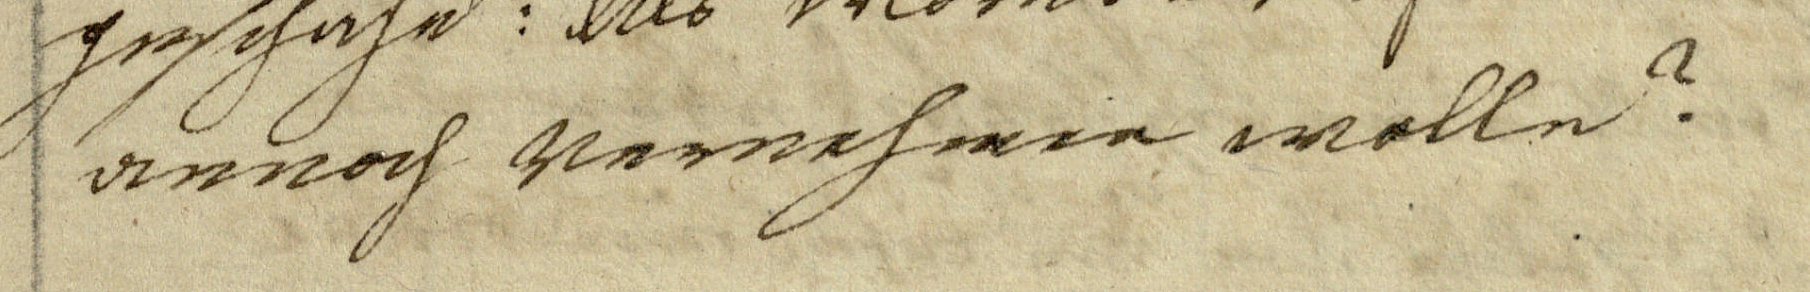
annoch vernehmen wolle?
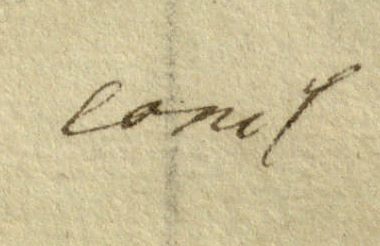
Concl
